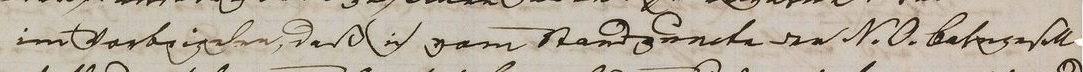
im Vorbeigehen, daß ich vom Standpuncte der N.O.Bahngesell-
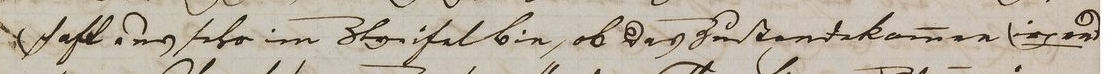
schaft aus sehr im Zweifel bin, ob das Zustandekommen irgend-
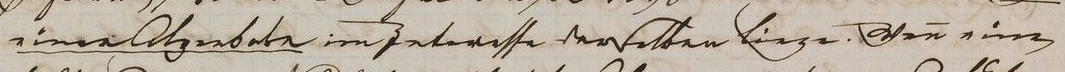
einer Alpenbahn im Interesse derselben liege. Wenn eine
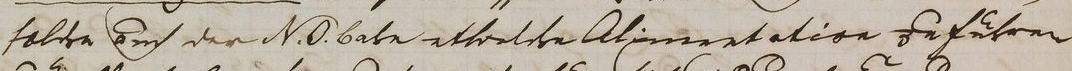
solche auch der N.O.Bahn etwelche Alimentation zuführen
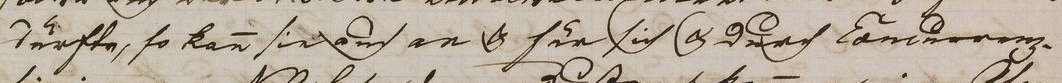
dürfte, so kann sie auch an & für sich & durch Concurrenz-
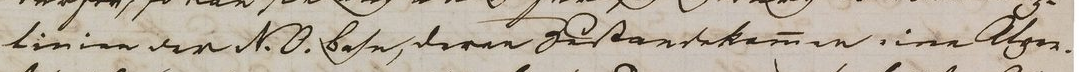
linien der N.O.Bahn, deren Zustandekommen eine Alpen -
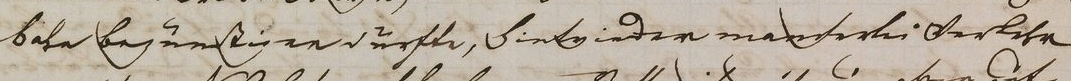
bahn begünstigen dürfte, hinwieder mancherlei Verkehr
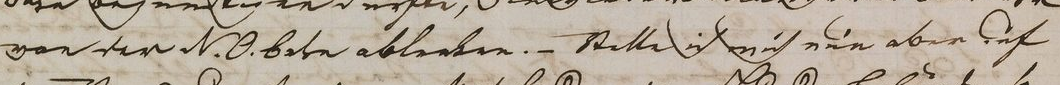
von der N.O.Bahn ablenken. – Stelle ich mich nun aber auf
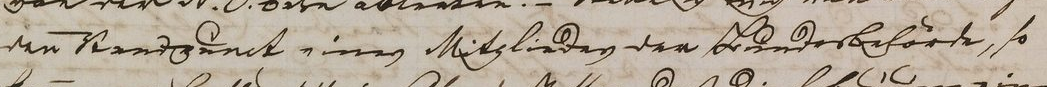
den Standpunct eines Mitgliedes der Bundesbehörde, so
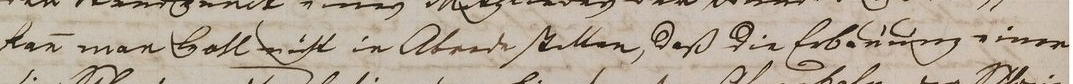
kann man wohl nicht in Abrede stellen, daß die Erbauung einer
